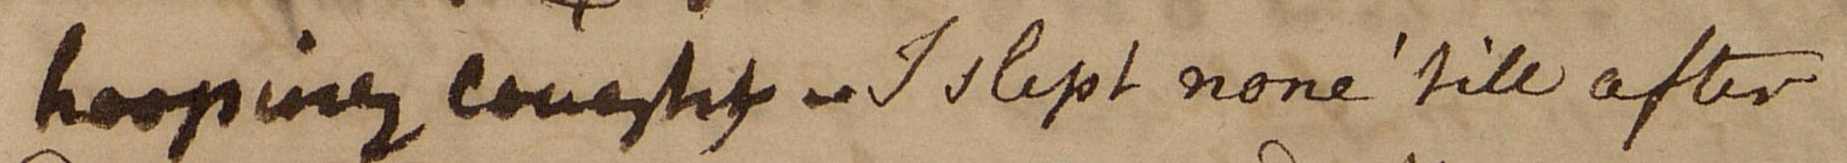hooping cought- I slept none 'till after
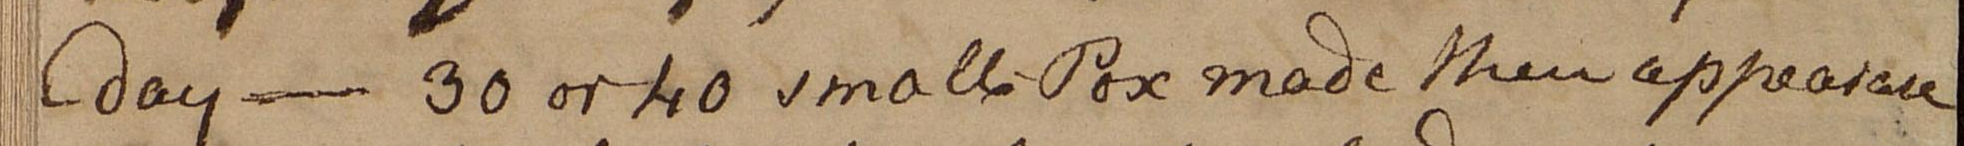day- 30 or 40 small Pox made their appearace
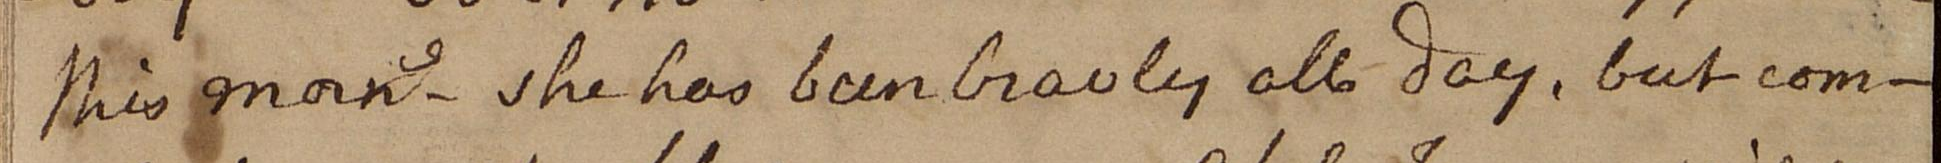this morn^g- she has been bravly all day, but com-
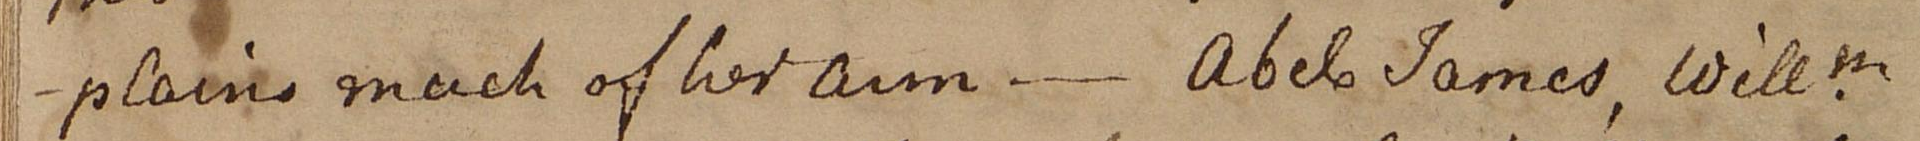-plains much of her arm- Abel James Will^m.
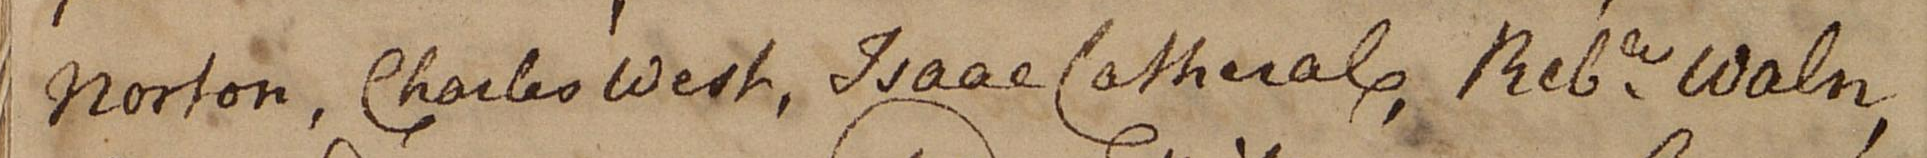Norton, Charles West, Isaac Catheral, Reb^a. Waln,
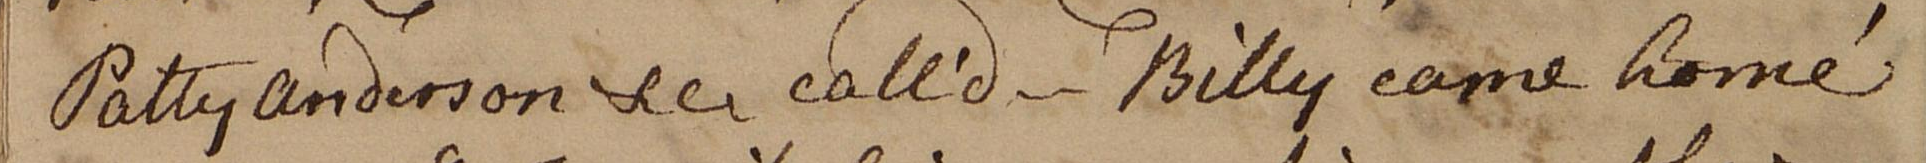Patty Anderson &c call'd- Billy came home
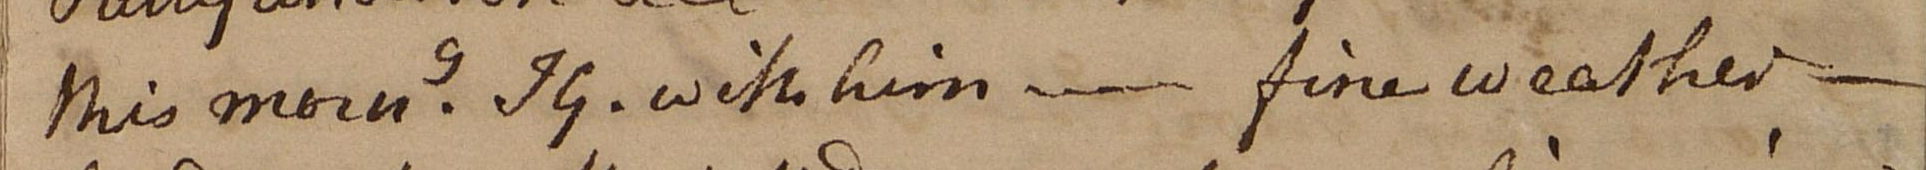this morn^g. JG. with him- fine weather-
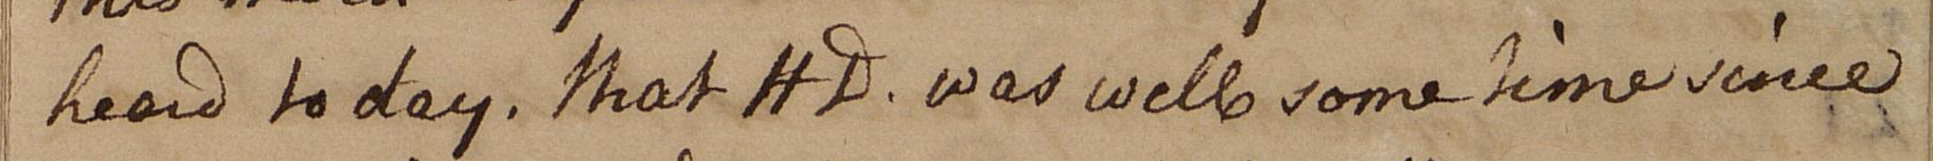heard to day. that HD. was well some time since
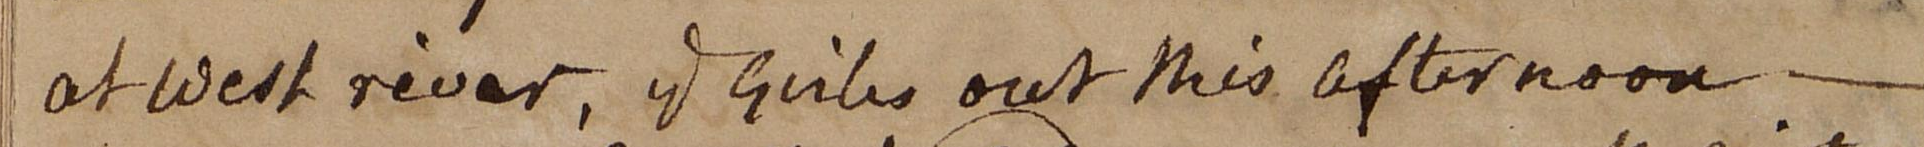at West river, y^e Girles out this afternoon-
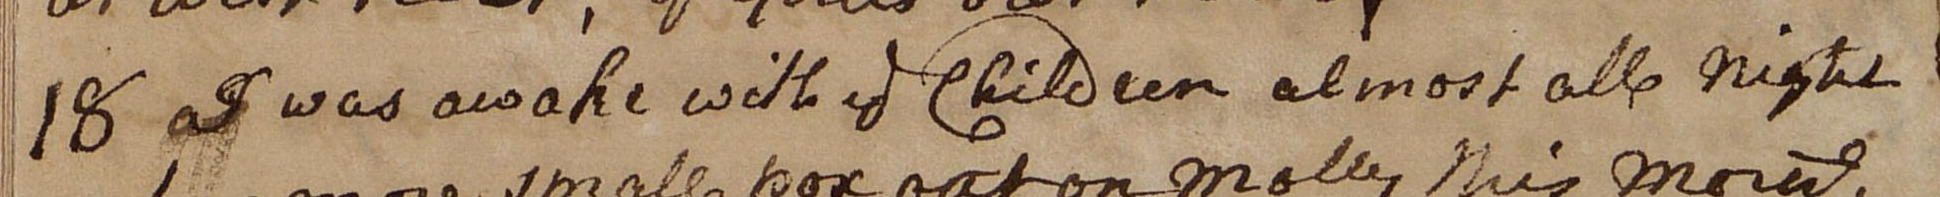18 I was awake with y^e Children almost all night
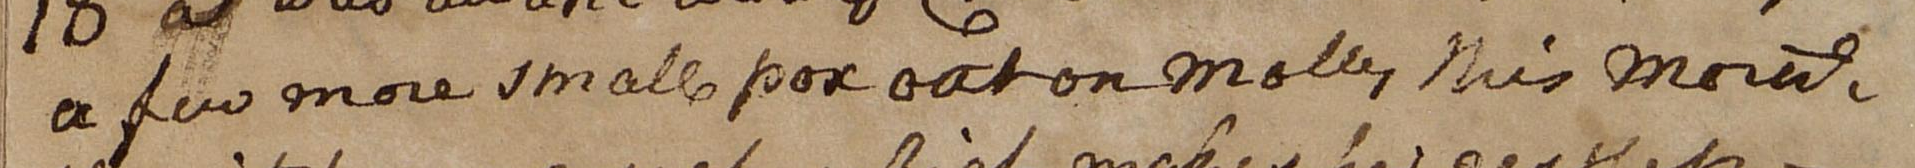a few more small pox out on Molly this morn^g.
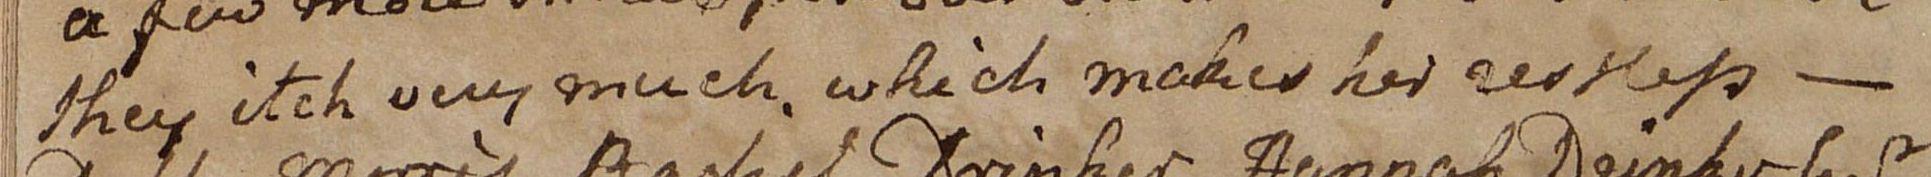they itch very much, which makes her restless-
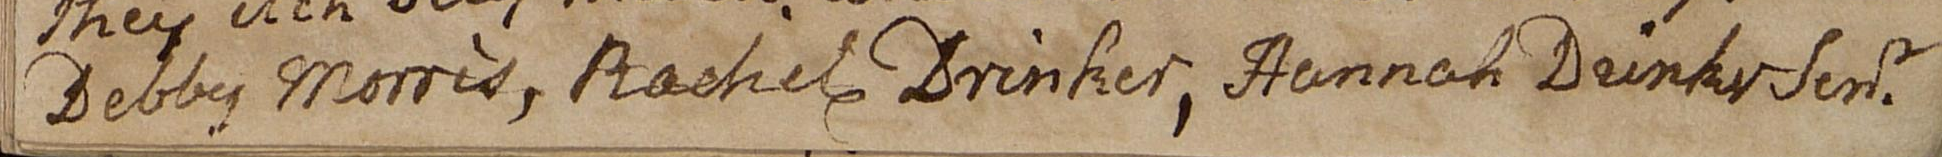Debby Morris, Rachel Drinker, Hannah Drinker Sen^r.
